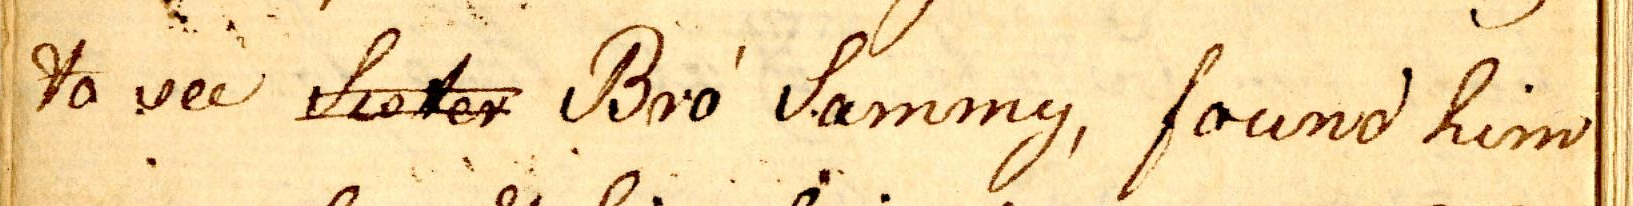to see Sister Bro' Sammy, found him
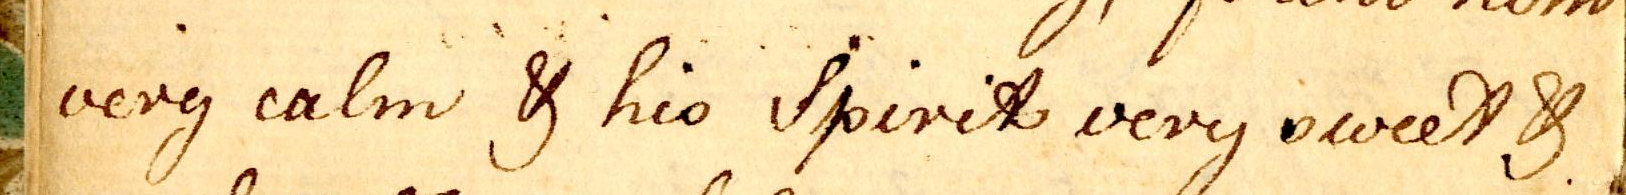very calm & his Spirit very sweet &
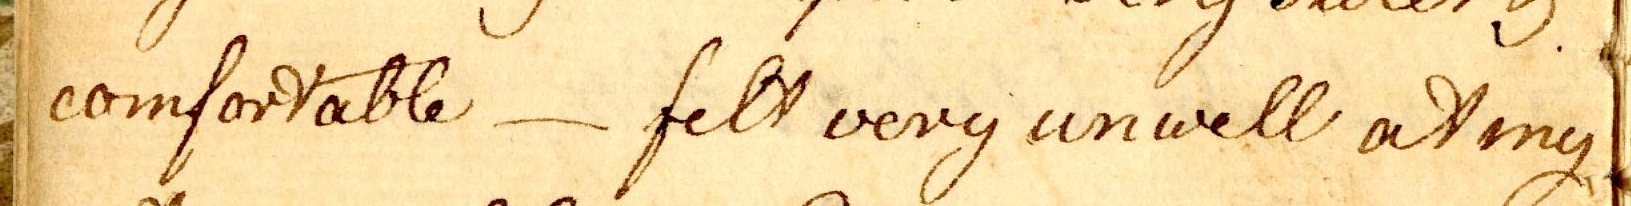comfortable- felt very unwell at my
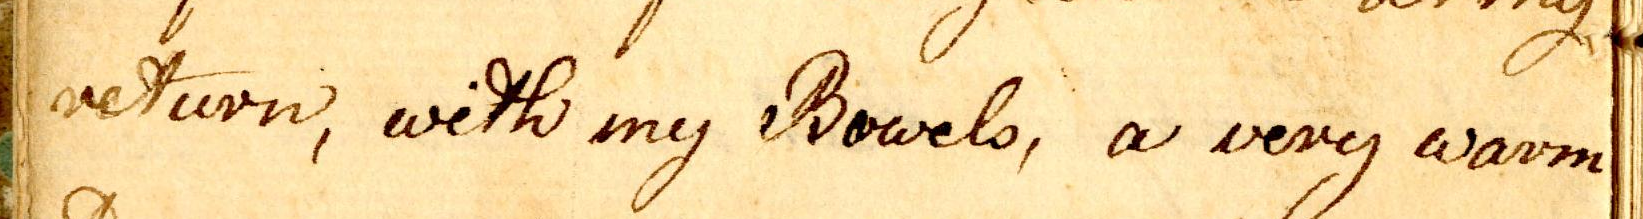return, with my Bowels, a very warm
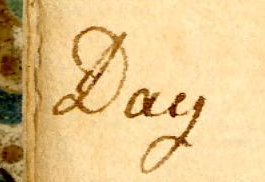Day
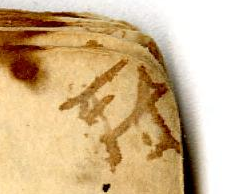47
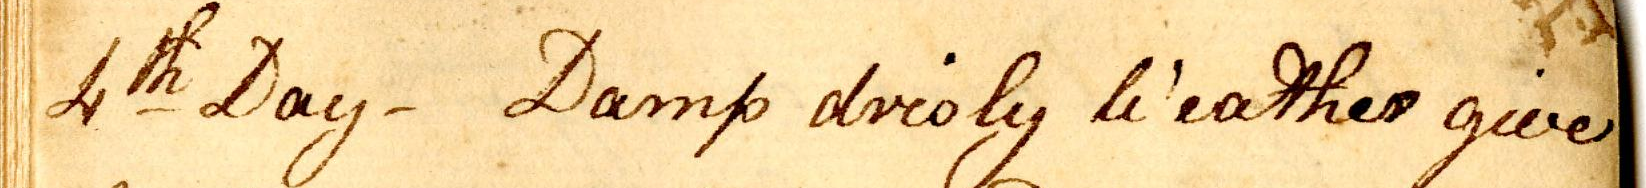4^th Day- Damp drisly Weather give
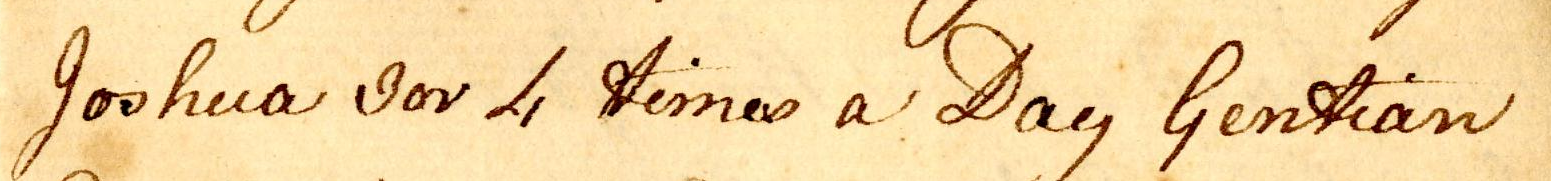Joshua 3 or 4 times a Day Gentian
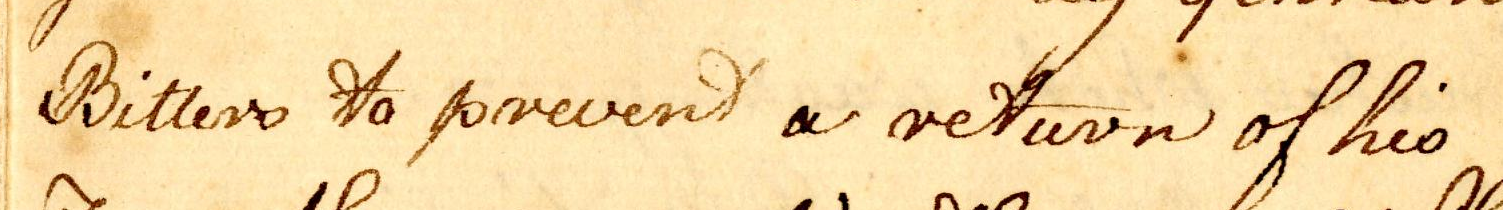Bitters to prevent a return of his
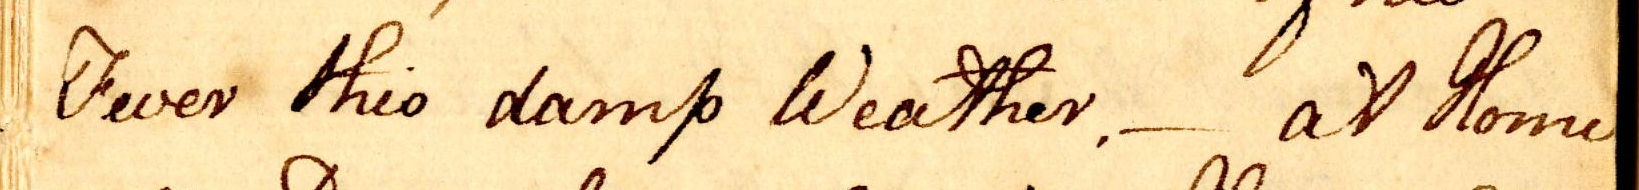Fever this damp Weather.- at Home
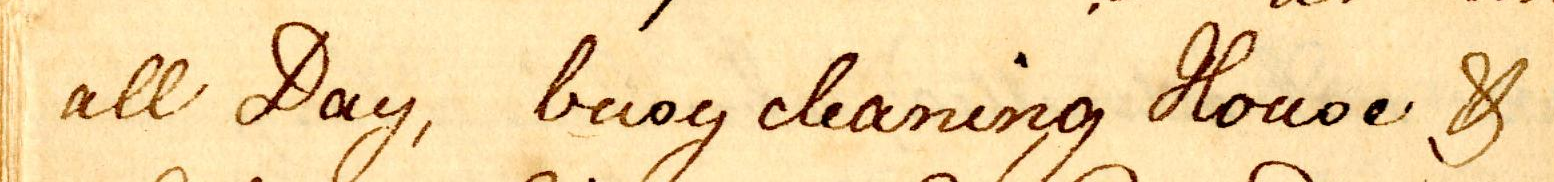all Day, busy cleaning House &
